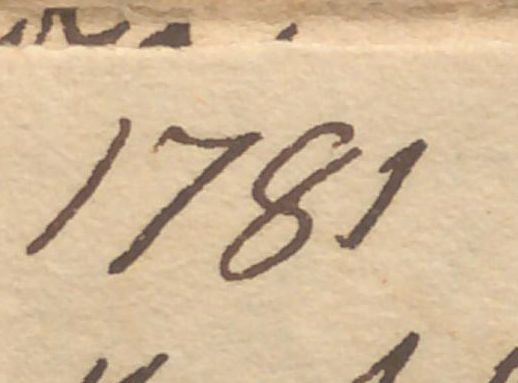1781
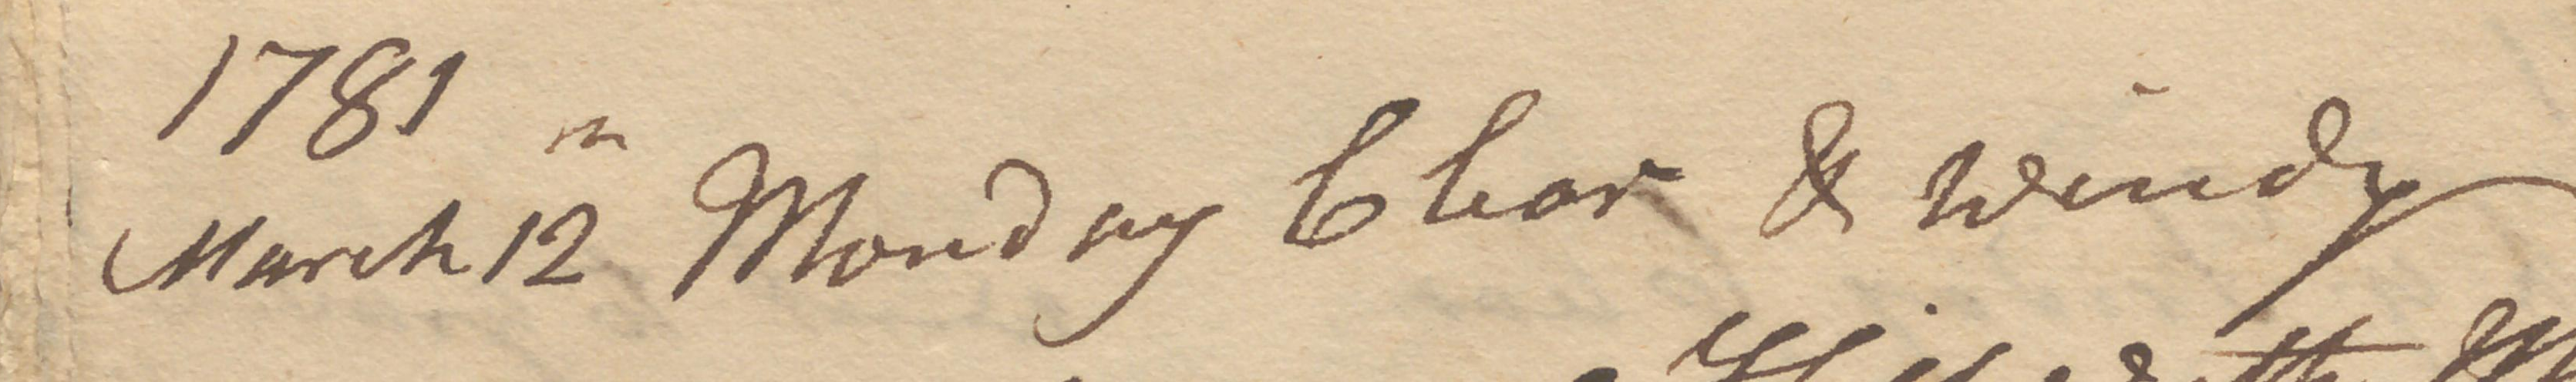March 12^th Monday Clear & windy
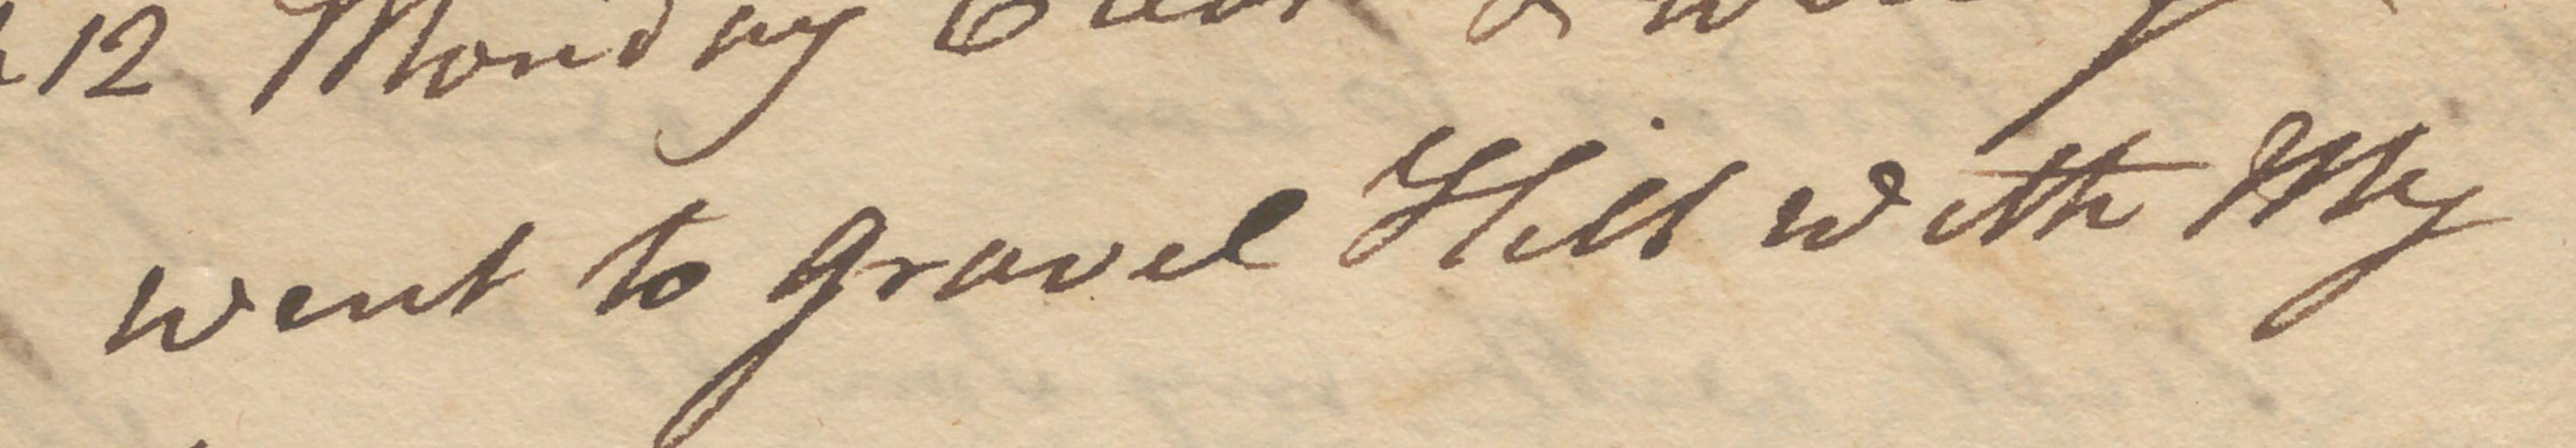went to Gravel Hill with My
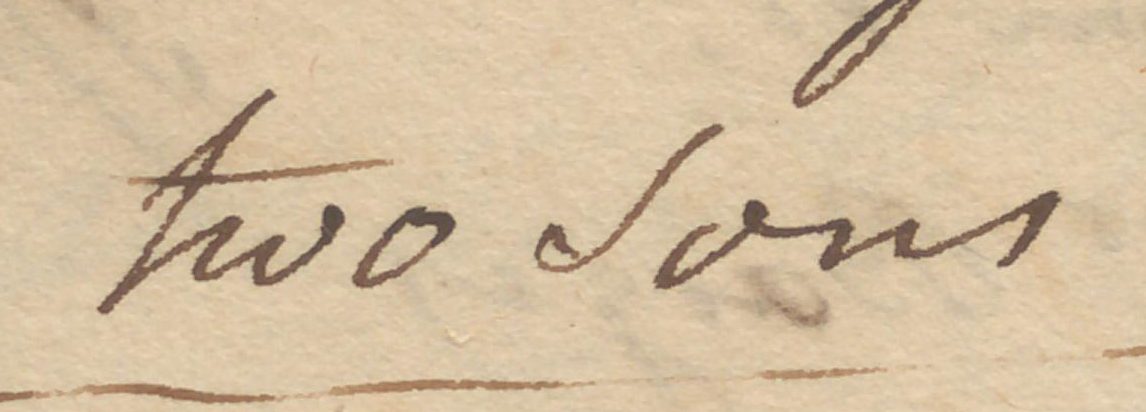two sons
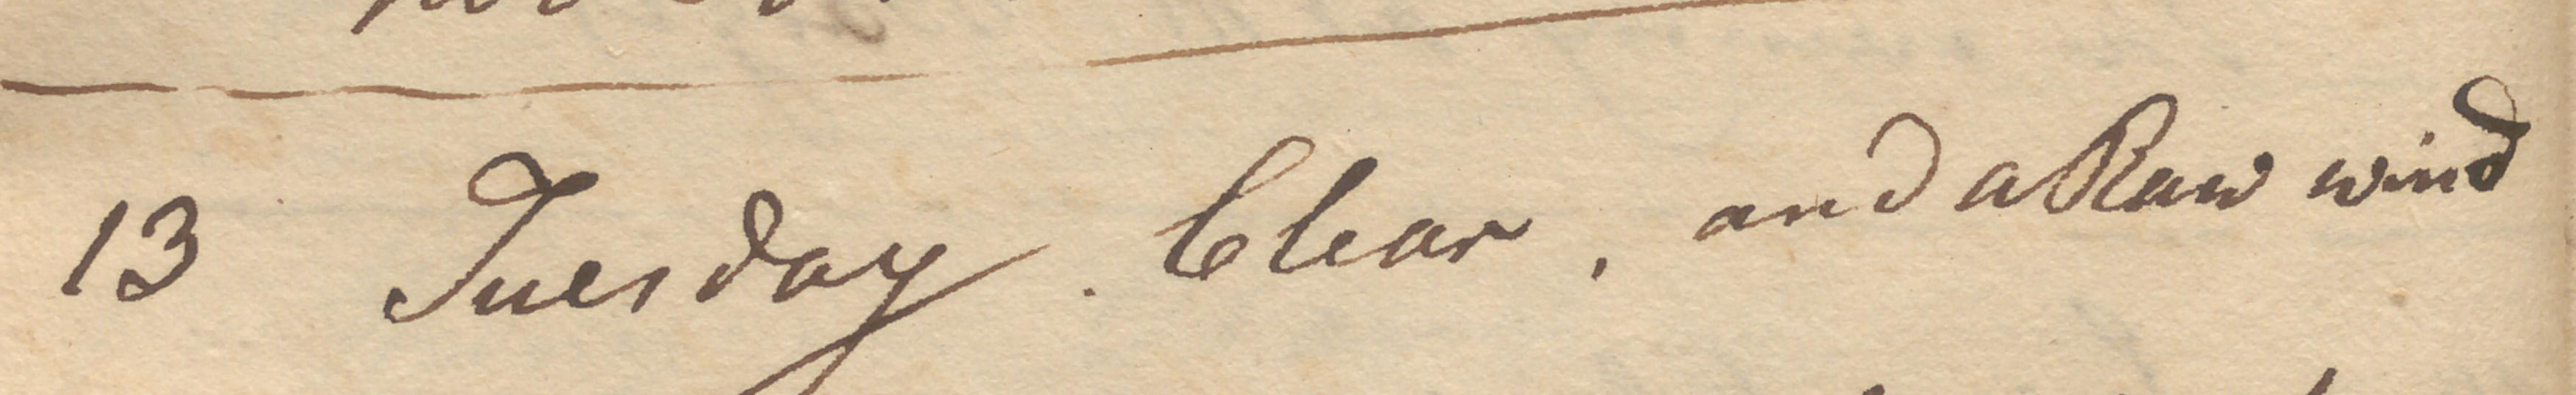13 Tuesday Clear and a Raw wind
